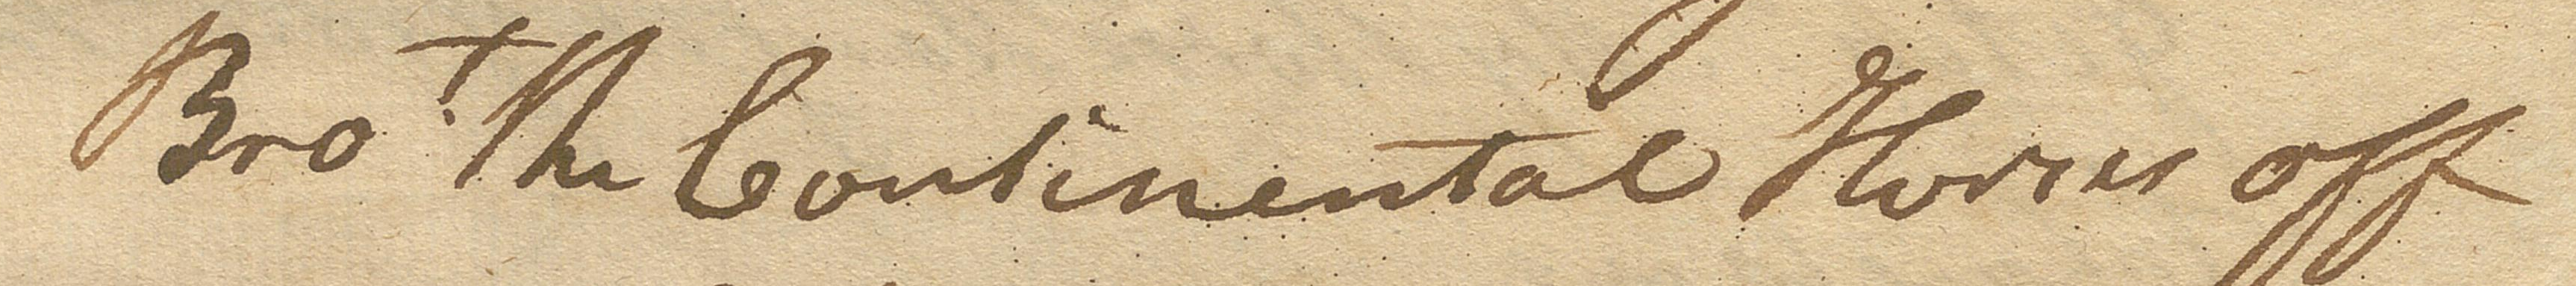Bro^t. the Continental Horses off
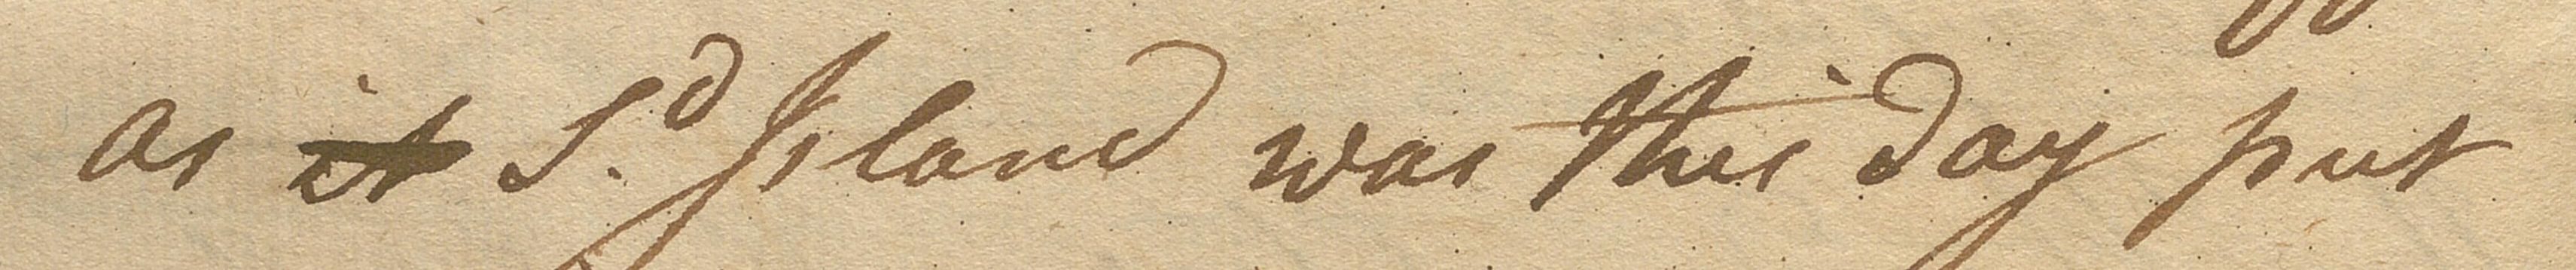as [it] s^d. Island was this day put
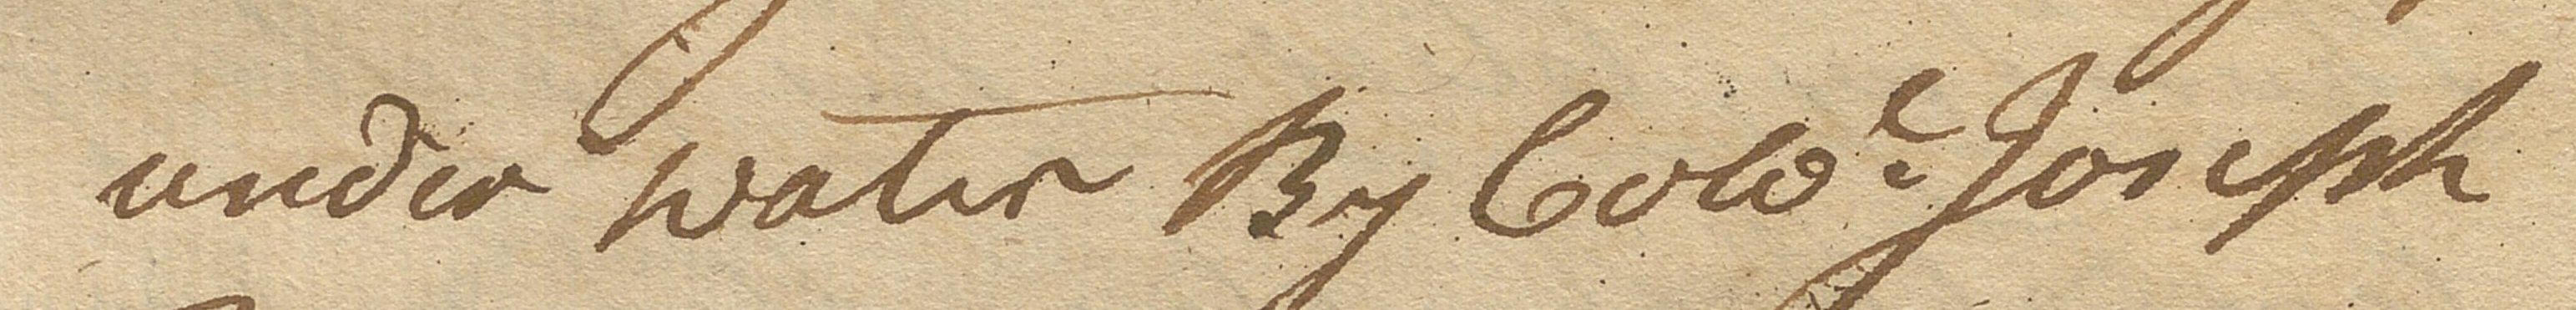under water By Colo^l. Joseph
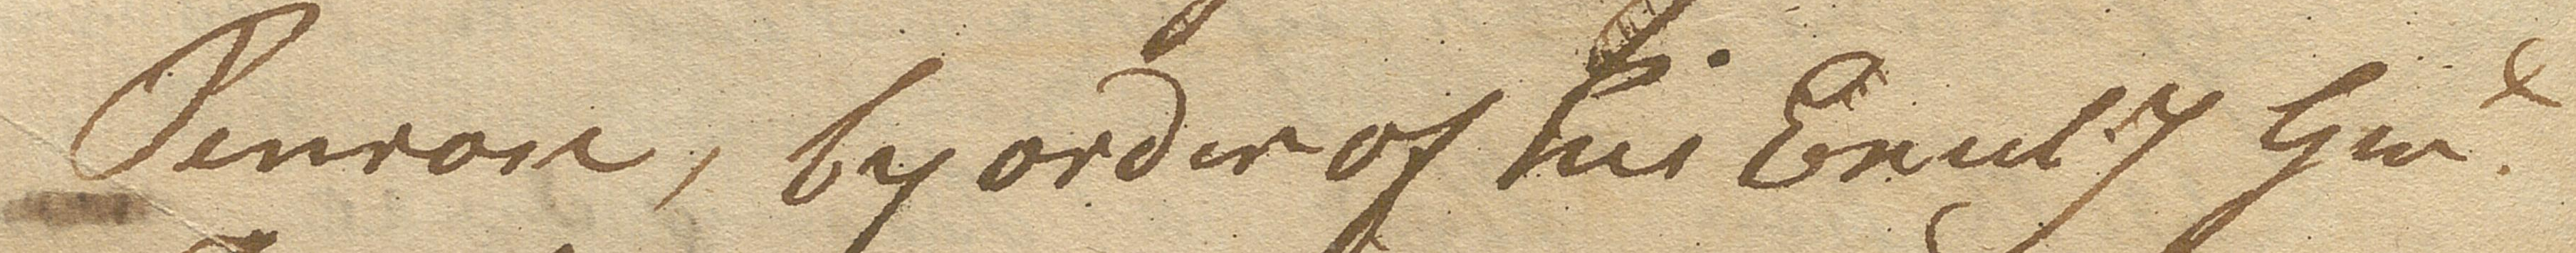Penrose, by order of his Excel^y. Gen^l.
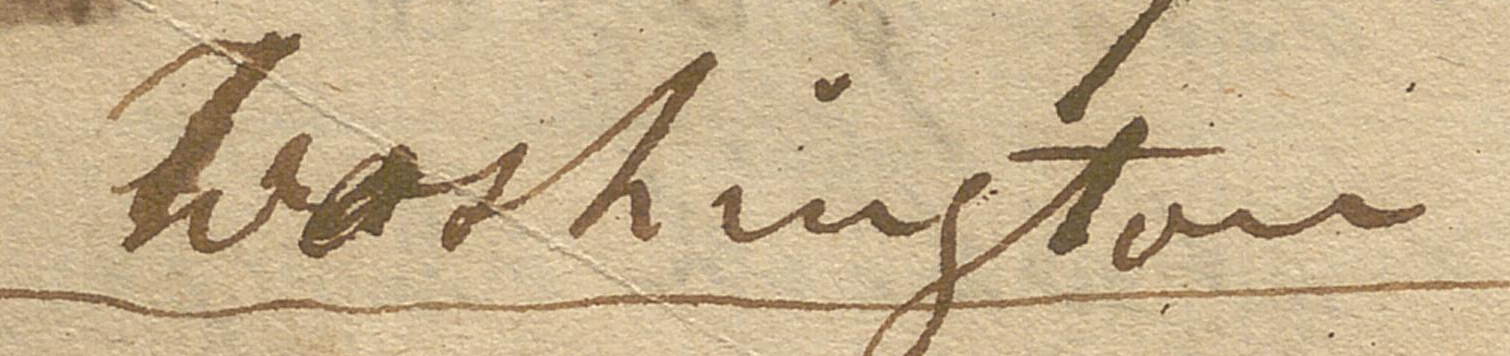Washington
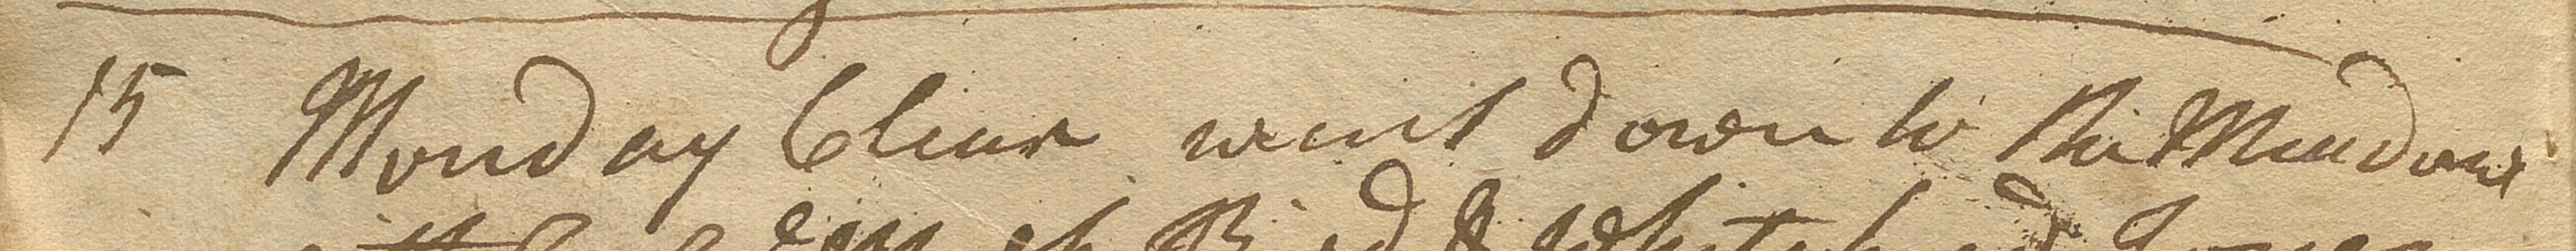15 Monday Clear went down to the Meadows
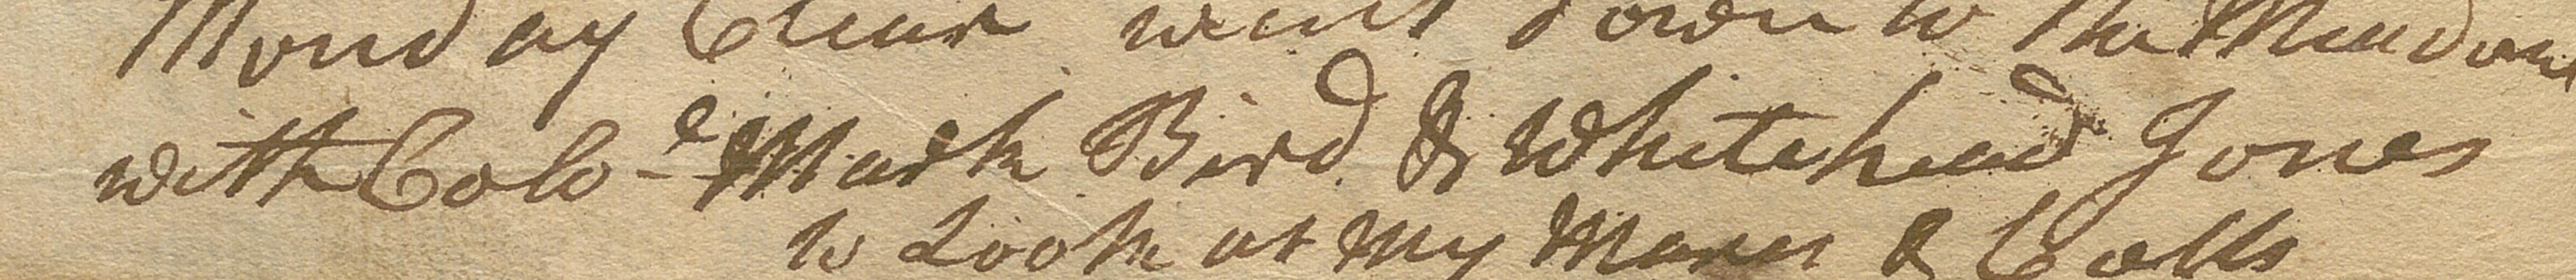with Colo^l. Mark Bird & Whitehead Jones
